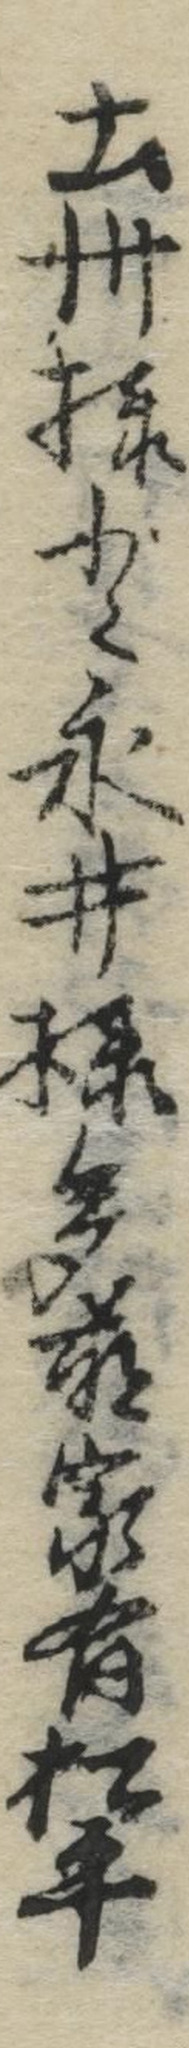土州様少々永井様多崩家有松平
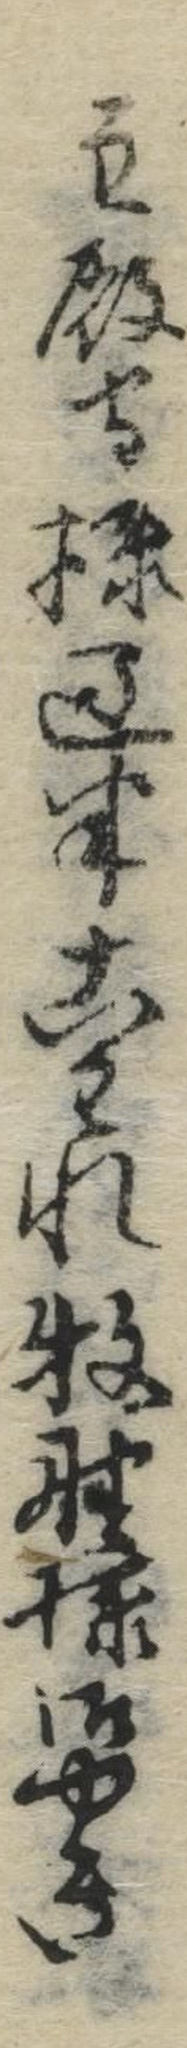主殿守様過半こわれ牧野様御やき
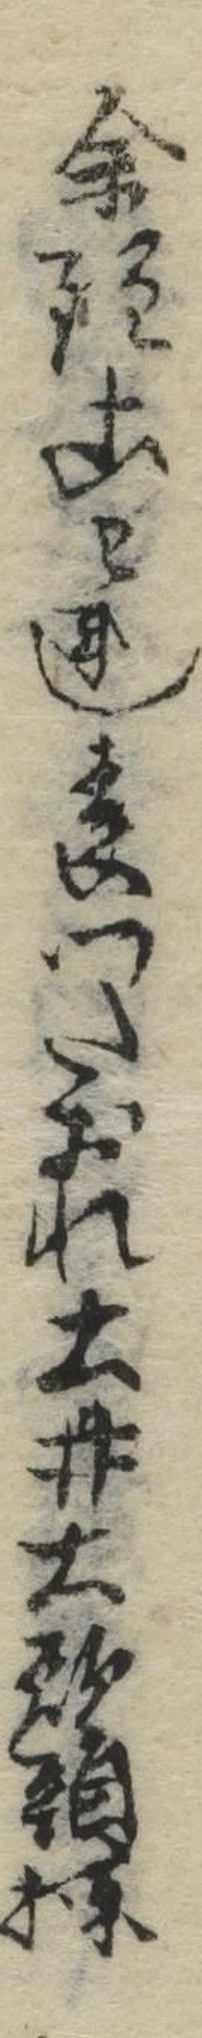余程こわれ表門たおれ土井大炊頭様
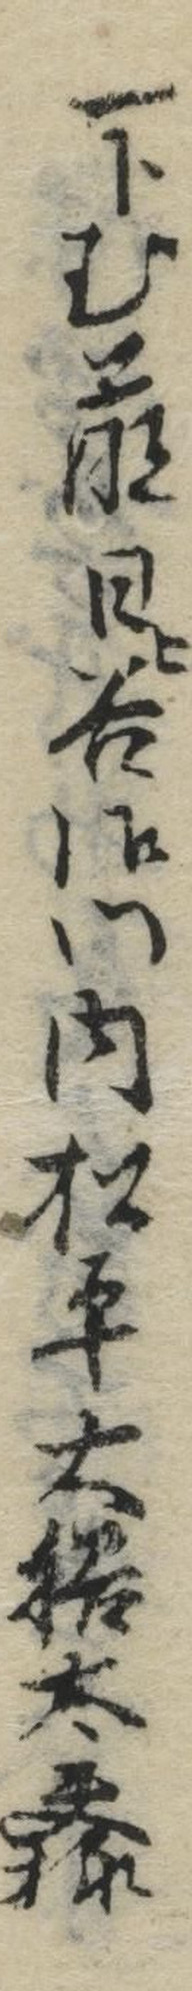一トむ崩日ヒ谷御門内松平大膳太夫様
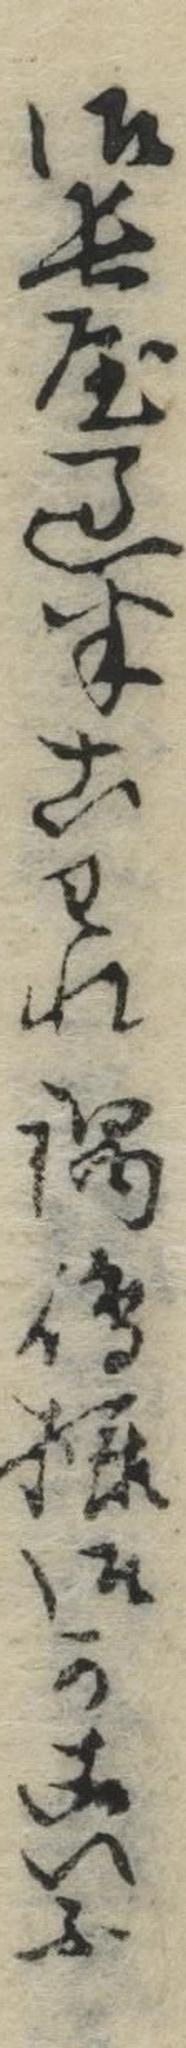御長屋過半こわれ鍋嶋様御かこい不
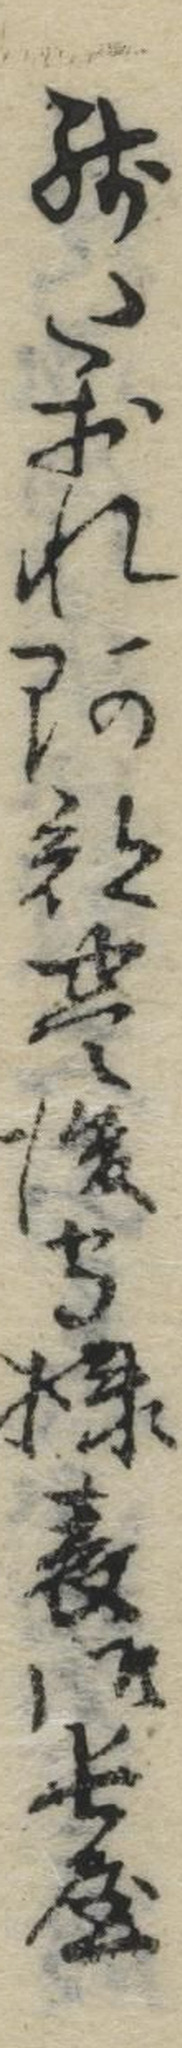残たおれ阿部豊後守様表御長屋
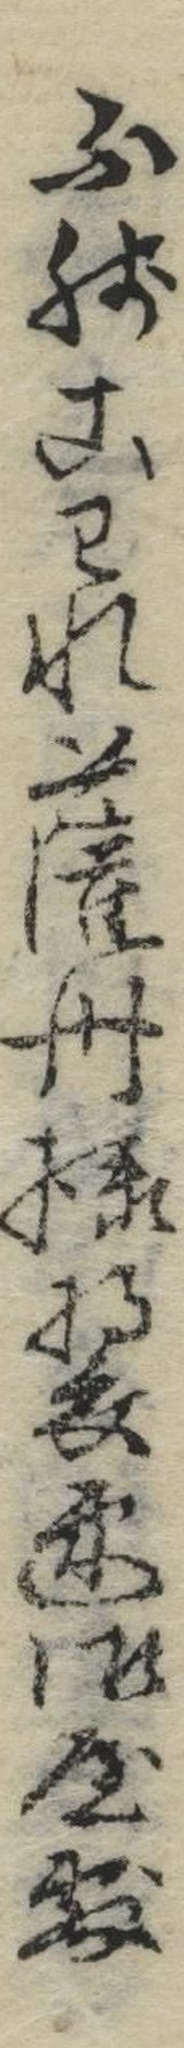不残こわれ薩州様装束御屋敷
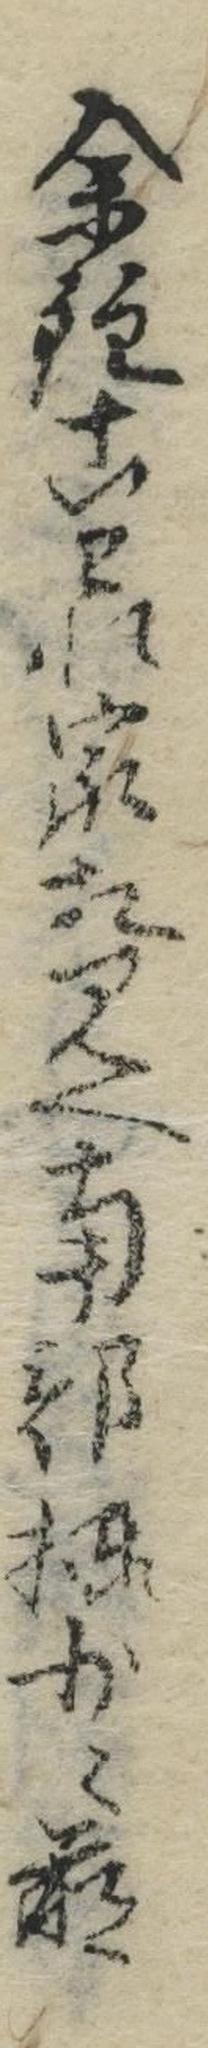余程こわれ家相見へ南部様少〻崩
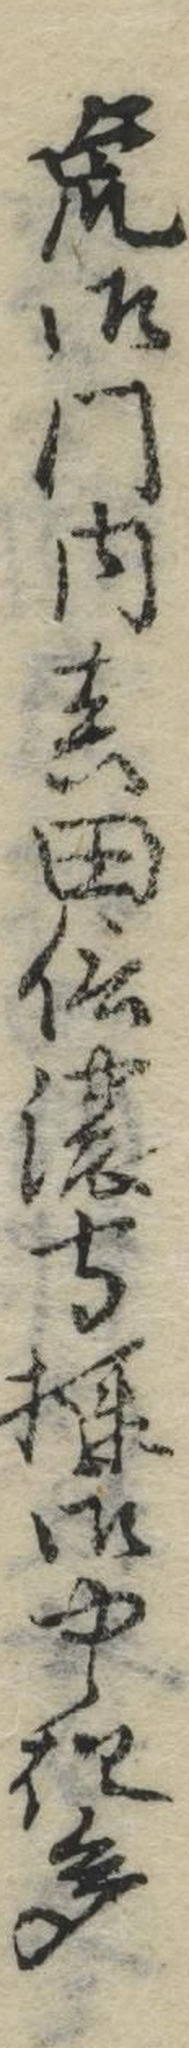虎御門内真田信濃守様御やしき多
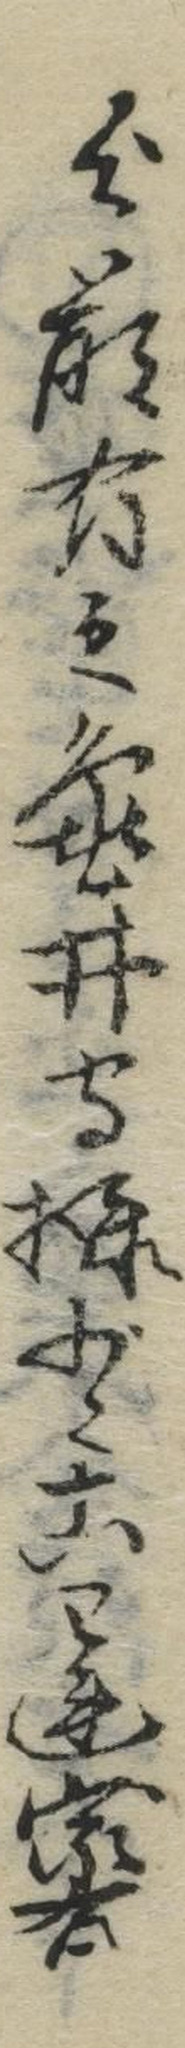分崩有之亀井守様少〻こわれ家有
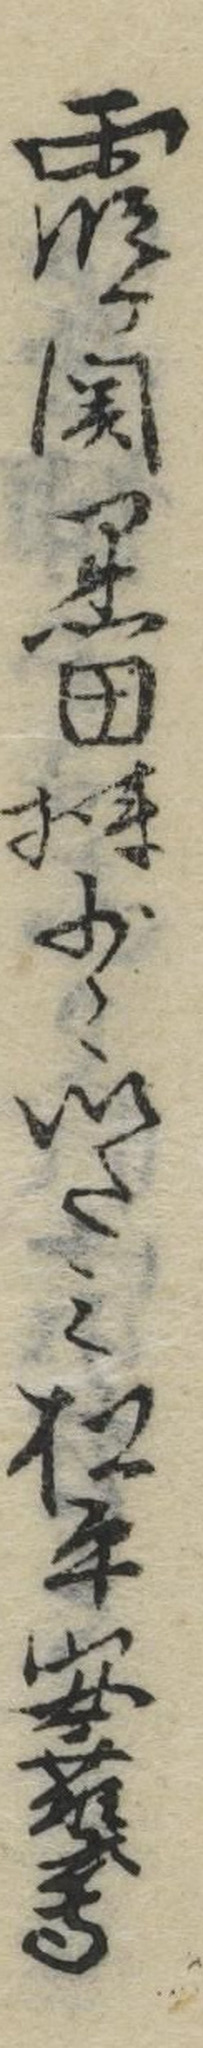霞ヶ関黒田様少〻いたみ松平安芸守
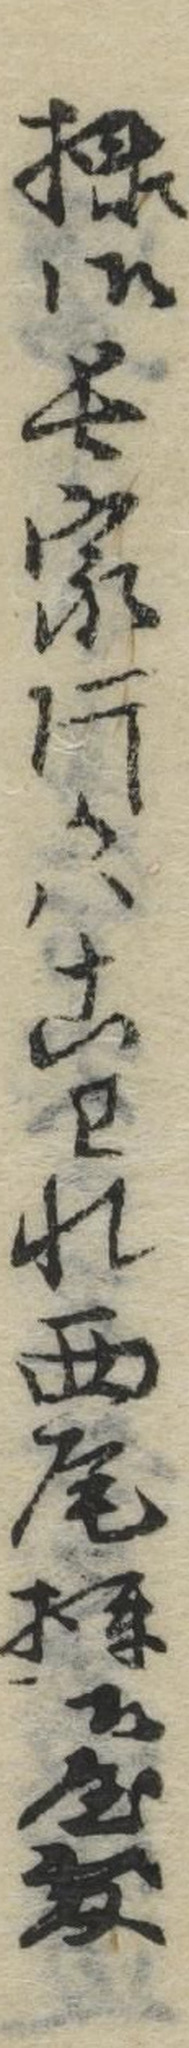様御長屋方かはこわれ西尾様御屋敷
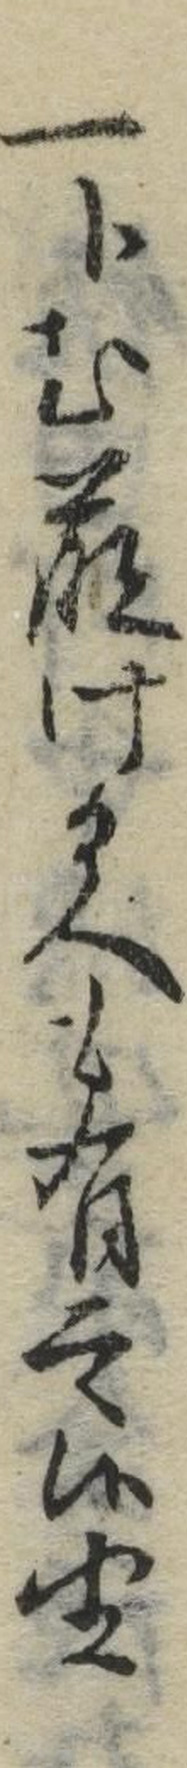一トむ崩けか人も有之候由
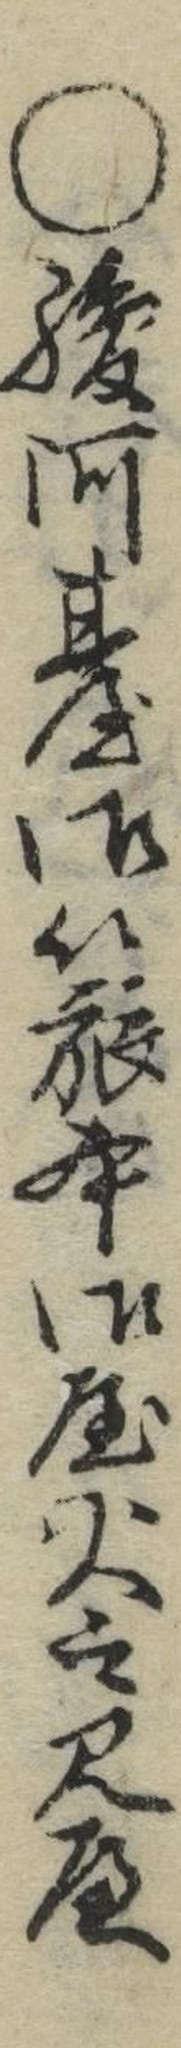○駿河台御旗本御屋火之見へ
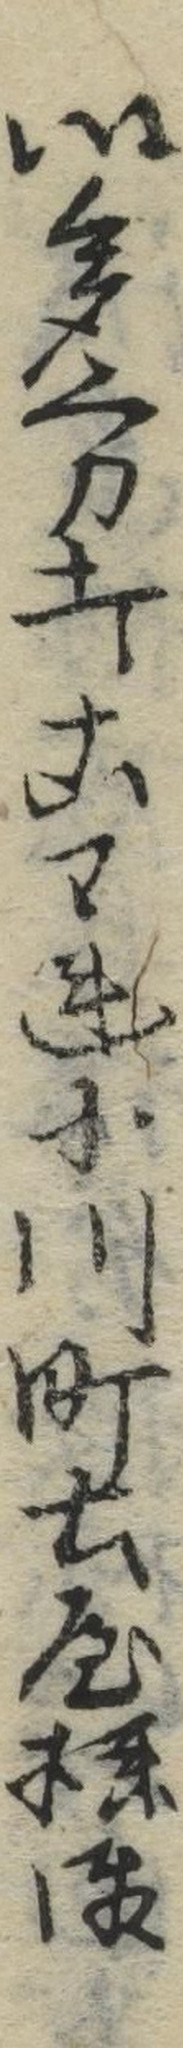い多分打こわれ小川町土屋様御
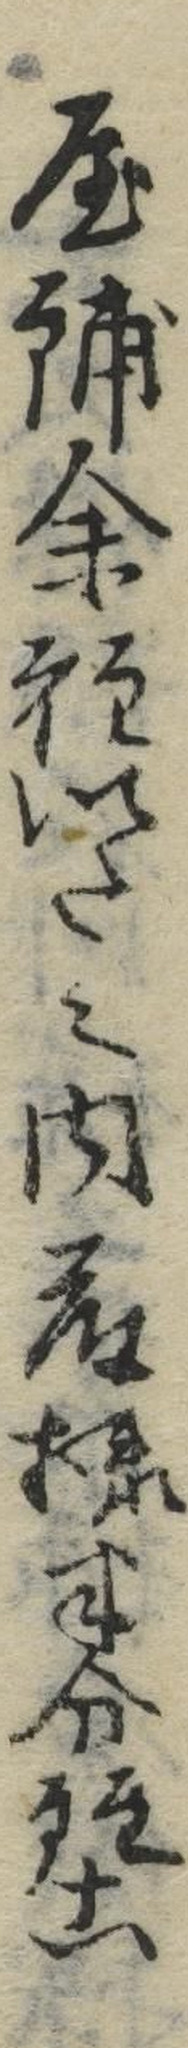屋鋪余程いたみ内藤様半分程こ
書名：安政三年辰八月廿五日夜　大江都御屋敷方寺社市中共　大嵐水入場所明細書之寫　并街道筋近郷聞書
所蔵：東京大学地震研究所図書室 Earthquake Research Institute Library, The University of Tokyo, JAPAN
